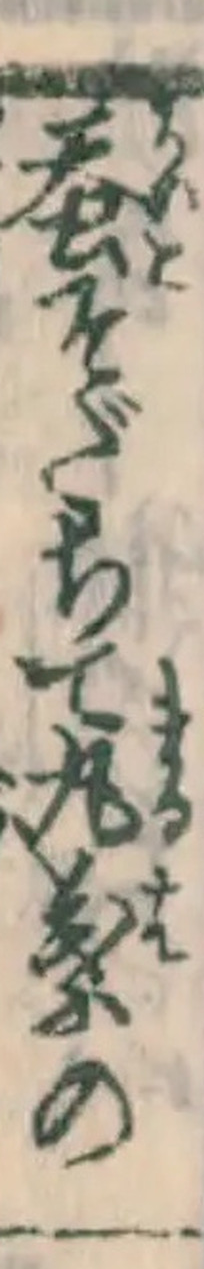蚕そだちて丸葉の
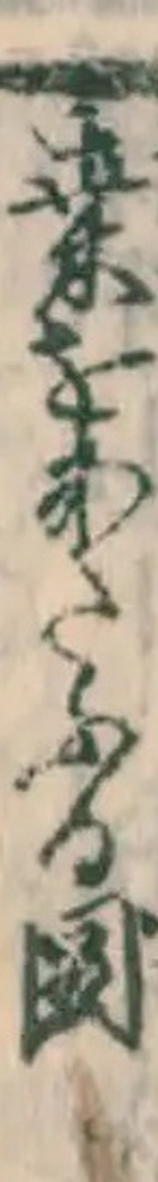桑をあたふる図
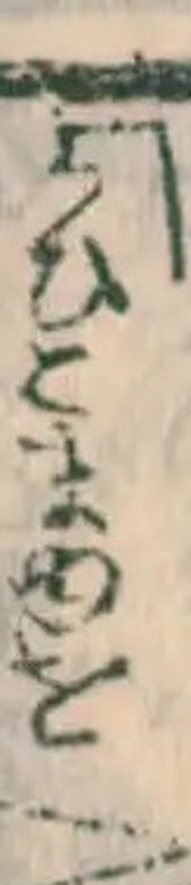「かひこまゆを
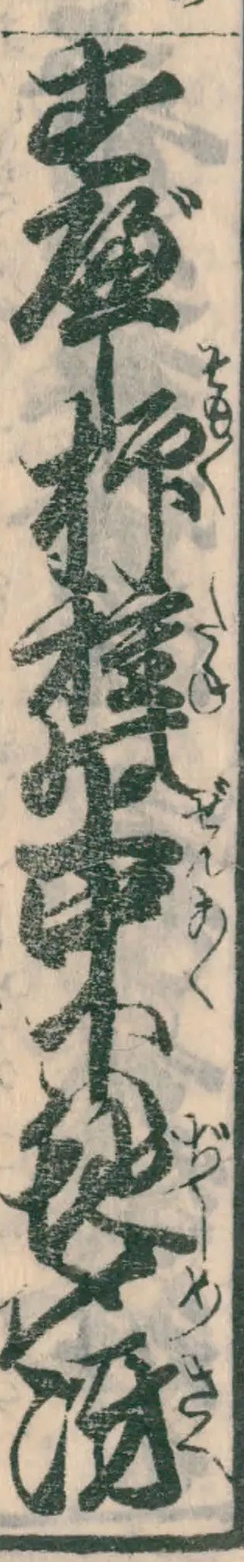すべし抑種の上中下は地〆冴
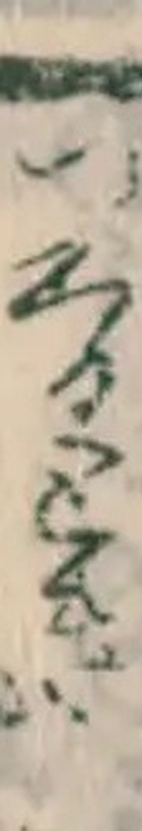つくるとき
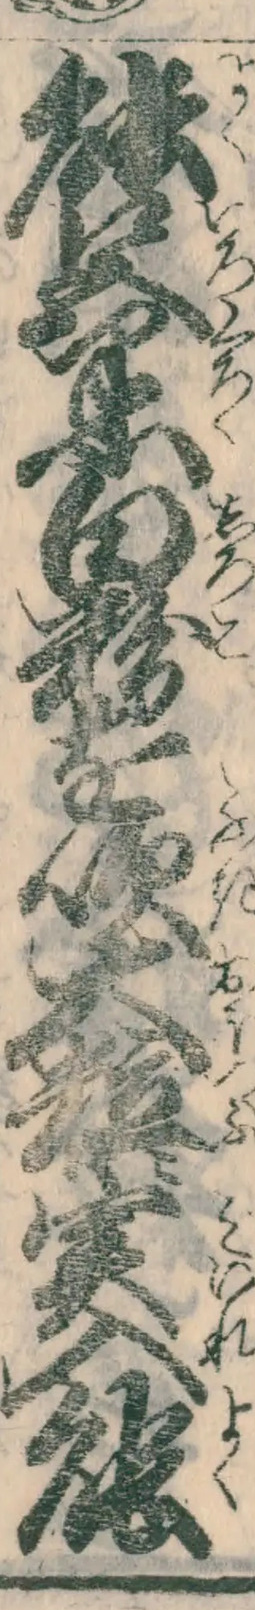能色黒白粉を吹大粒に実入能
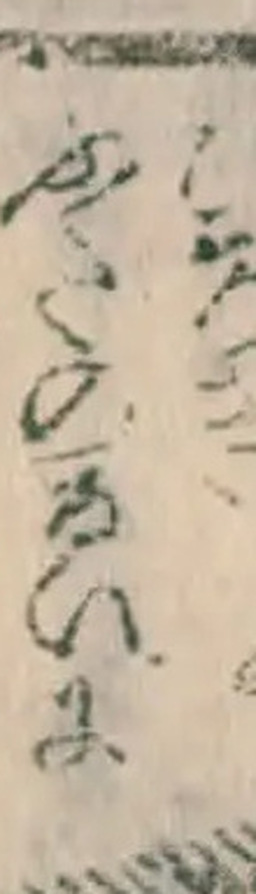ふたのるいに
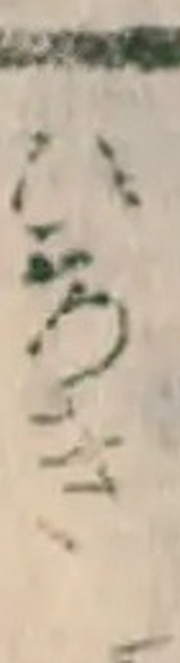ひろき
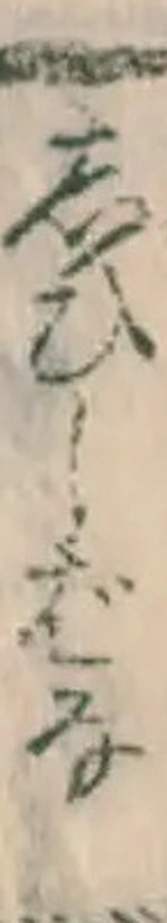しひしばな
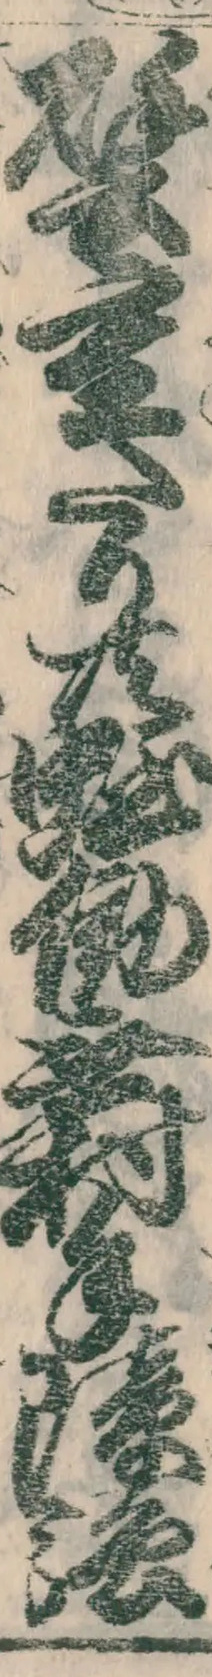譬重たり共蛭働無村手障強
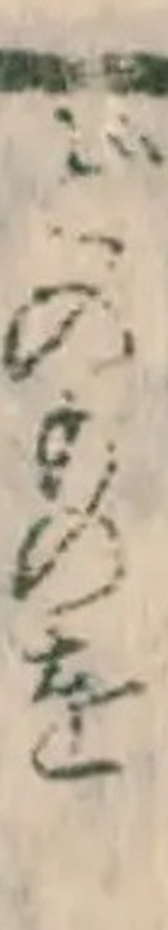どのものを
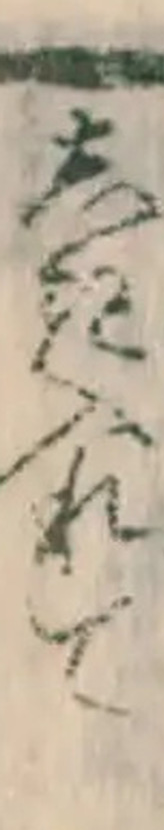しき入れて
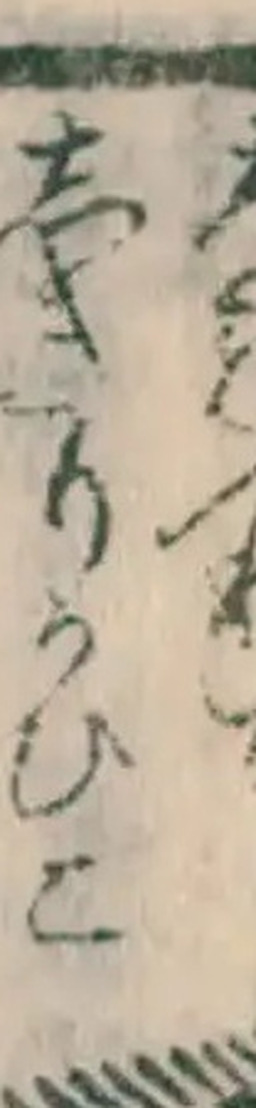しきりかひこ
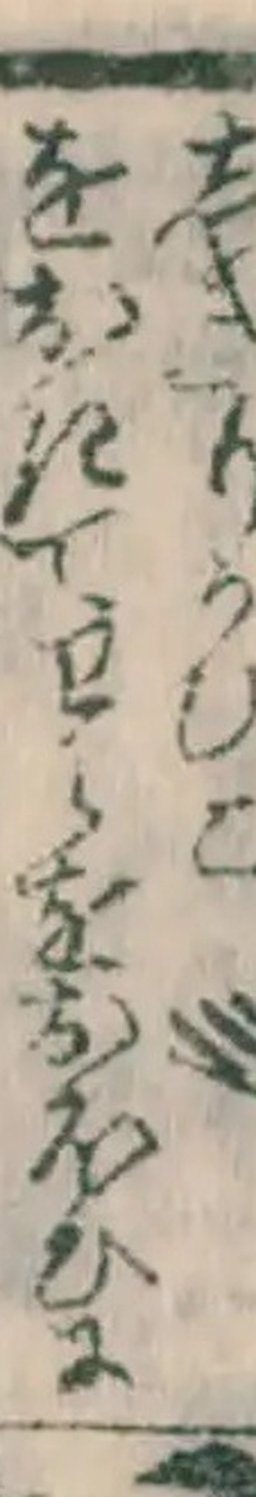をおきてわらをおほひに
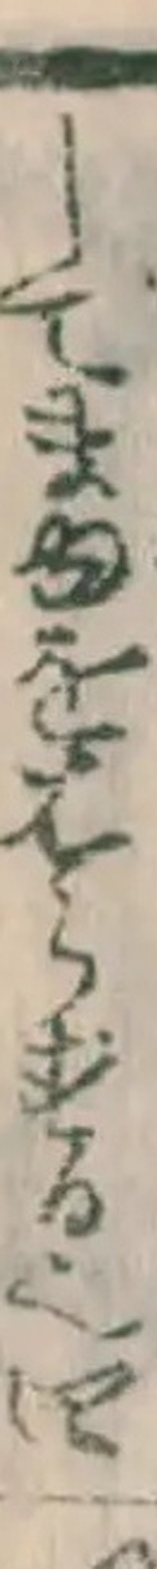してまゆをはらする也四
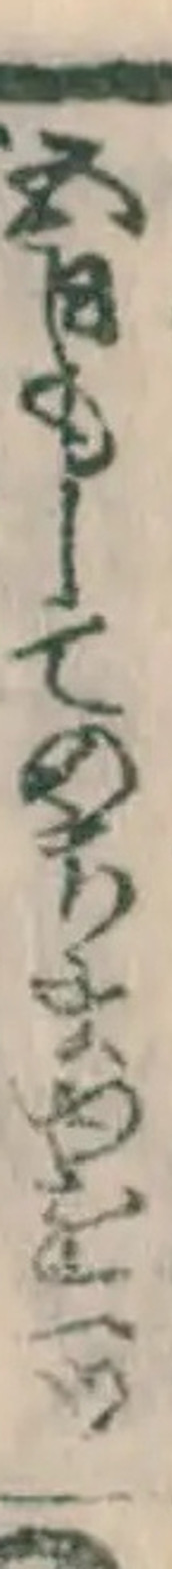五日もしてのちまゆを一ツ
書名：養蚕往来
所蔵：国立国会図書館 National Diet Library, JAPAN
